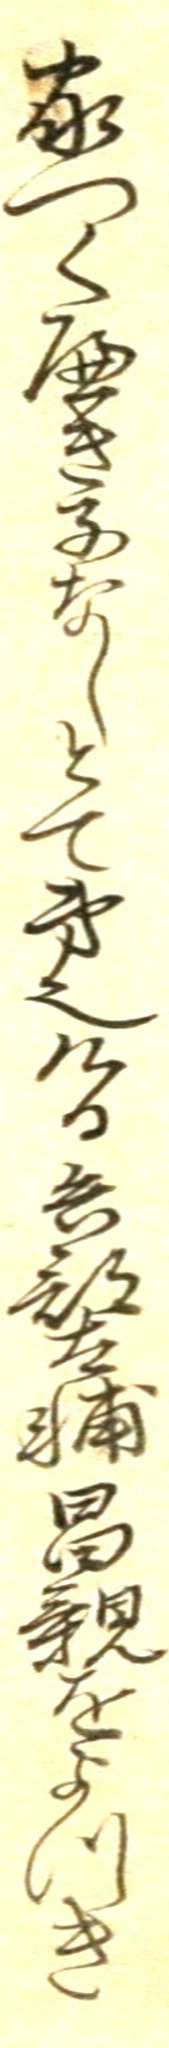家つくへき子なしとて弟也ける兵部太輔昌親をよつき
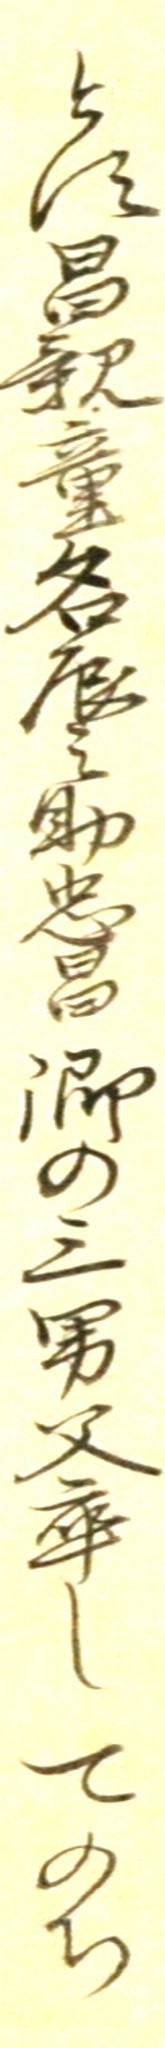とす昌親童名辰之助忠昌卿の三男父卒してのち

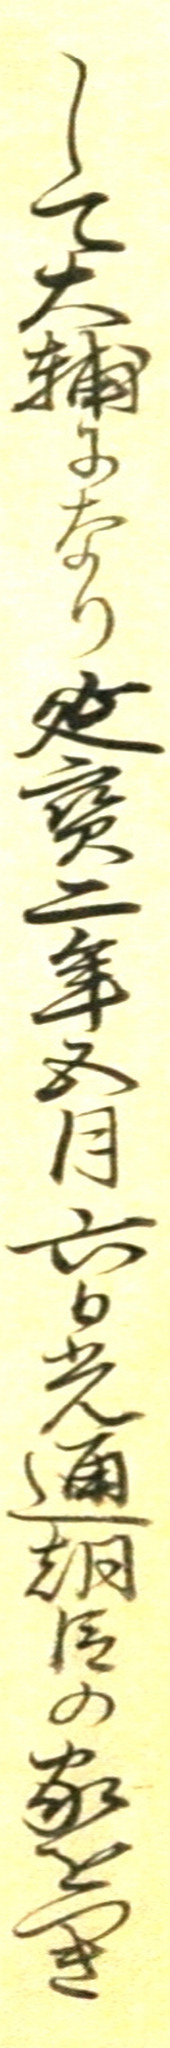して大輔になり延宝二年五月六日光通朝臣の家をつき
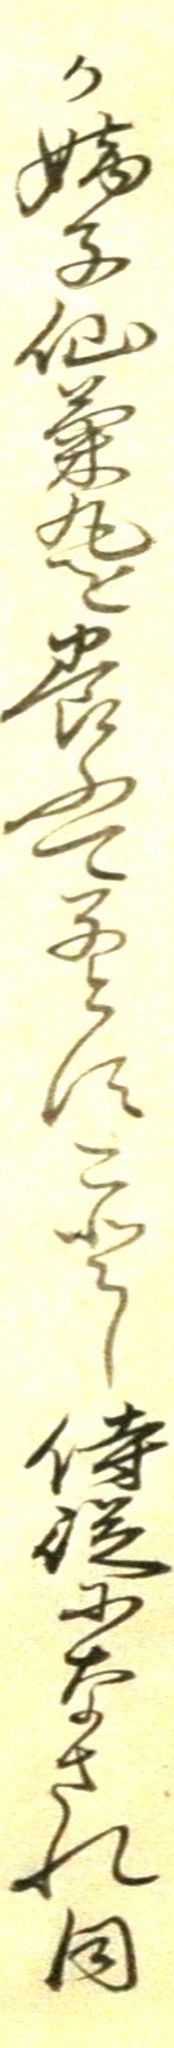か嫡子仙菊丸を養ふて子とすことし侍従になされ同
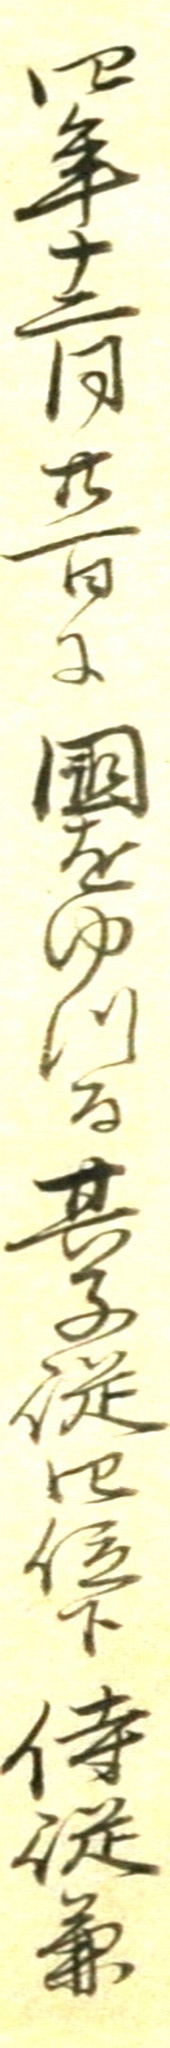四年十二月廿一日に国をゆつる其子従四位下侍従兼
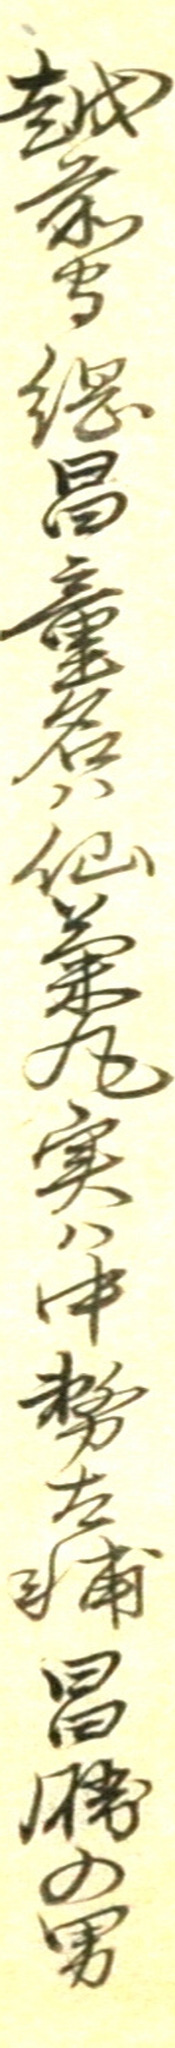越前守綱昌童名は仙菊丸実は中務太輔昌勝の男
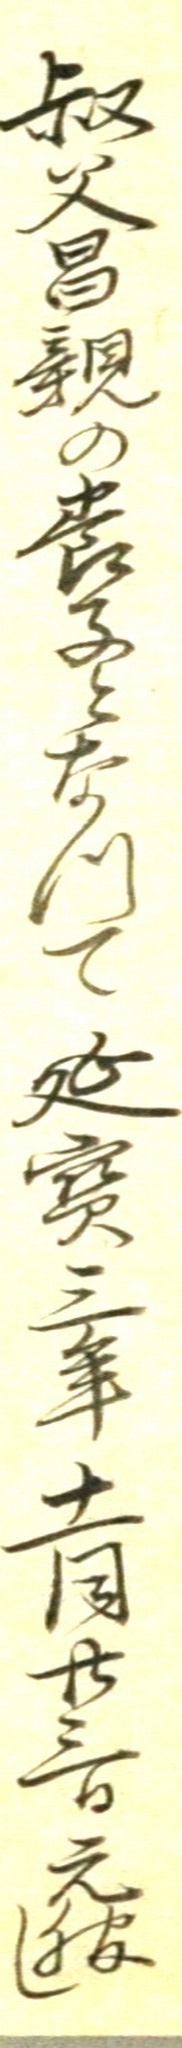叔父昌親の養子となつて延宝三年十一月廿三日元服し
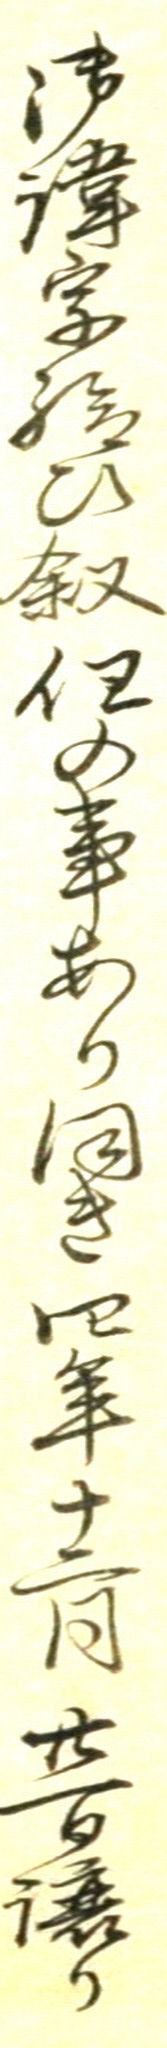御諱字給ひ叙任の事あり同き四年十二月廿一日譲り
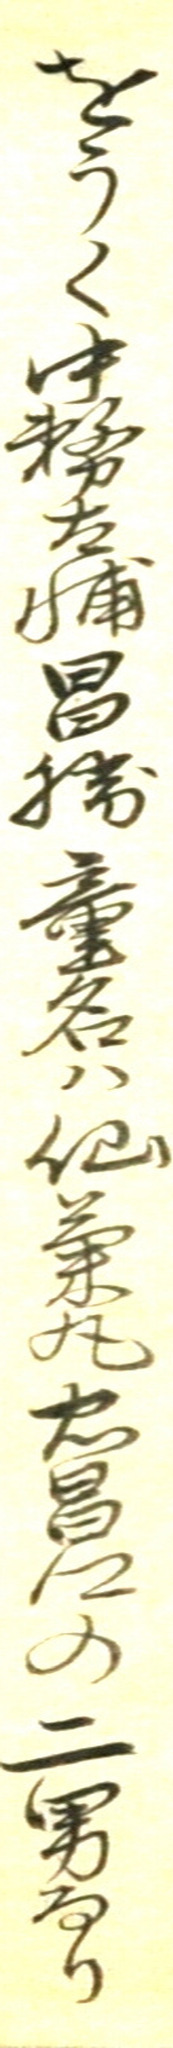をうく中務太輔昌勝童名は仙菊丸忠昌卿の二男なり
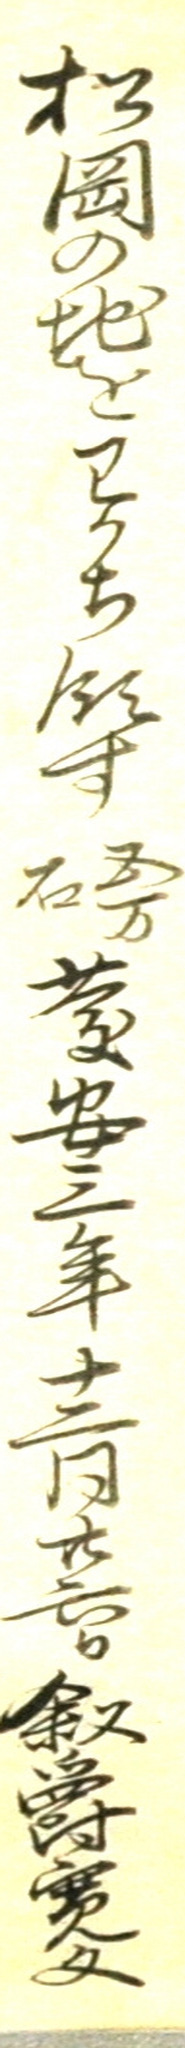松岡の地をわかち領す五万石慶安三年十二月廿六日叙爵寛文
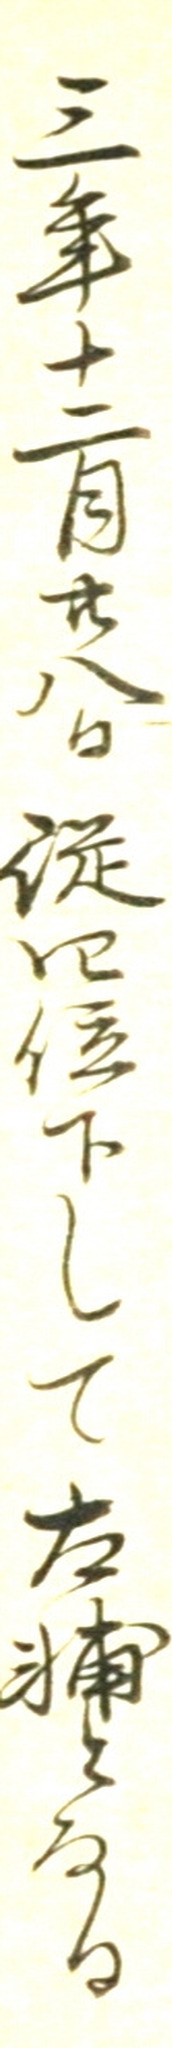三年十二月廿八日従四位下して太輔となる
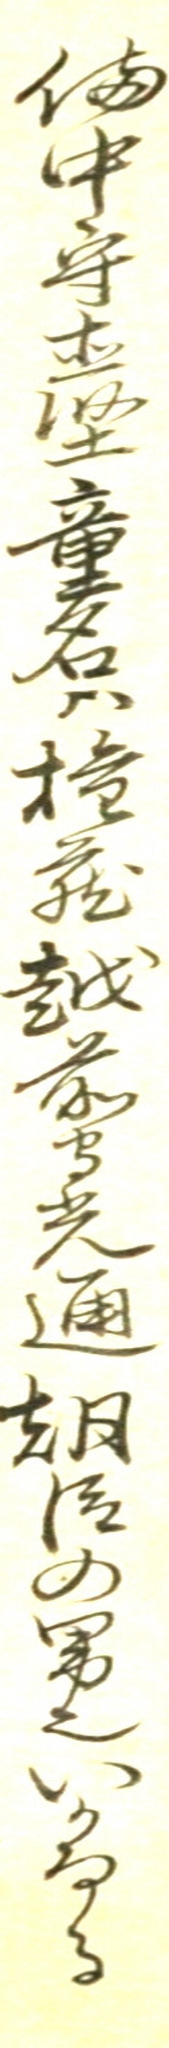備中守直堅童名は権蔵越前守光通朝臣の男也いかなる
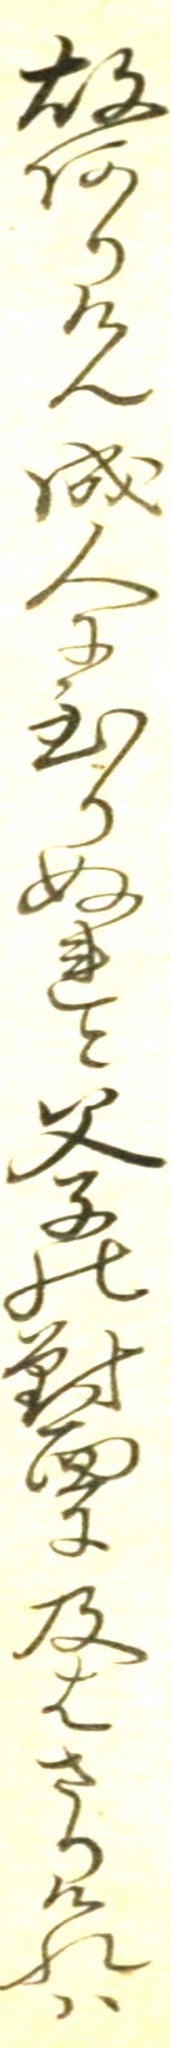故ありけん成人に至りぬれと父子の対面に及はさりけれは
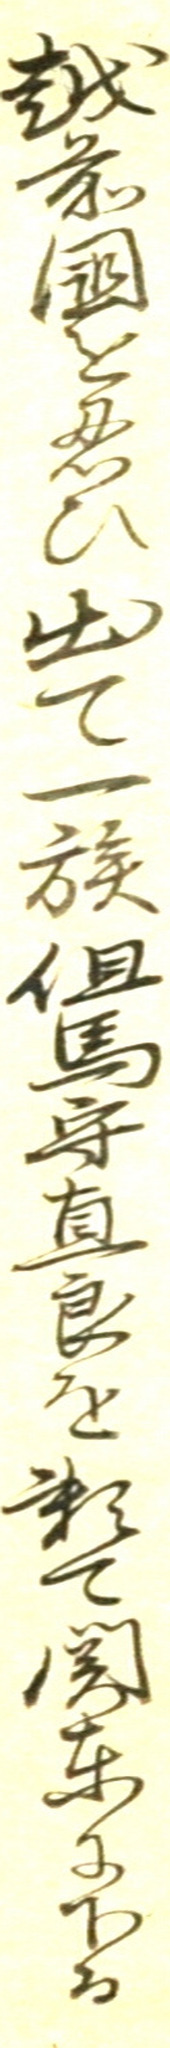越前国を忍ひ出て一族但馬守直良を頼て関東に下る
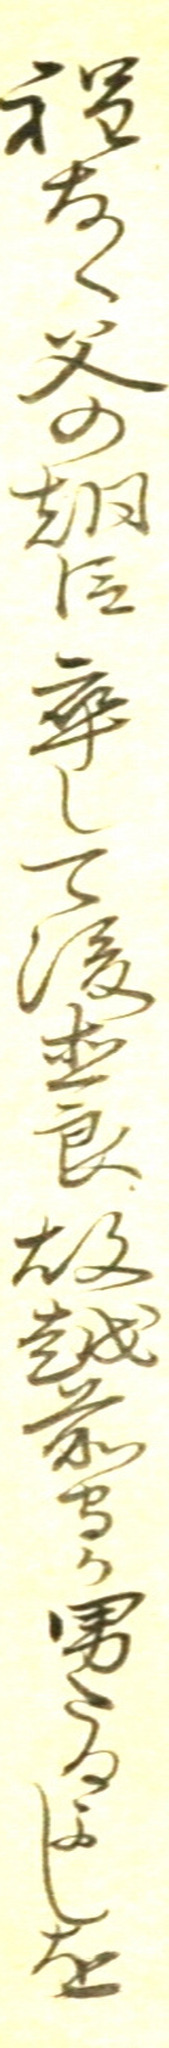程なく父の朝臣卒して後直良故越前守か男たるよしを
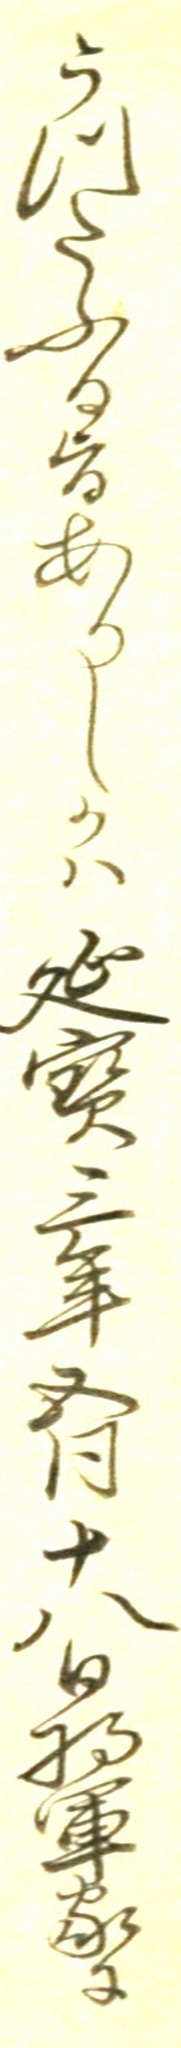うつたふる旨ありしかは延宝三年五月十八日将軍家に
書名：藩翰譜（一）
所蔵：伊那市立高遠町図書館・合同会社AMANE
